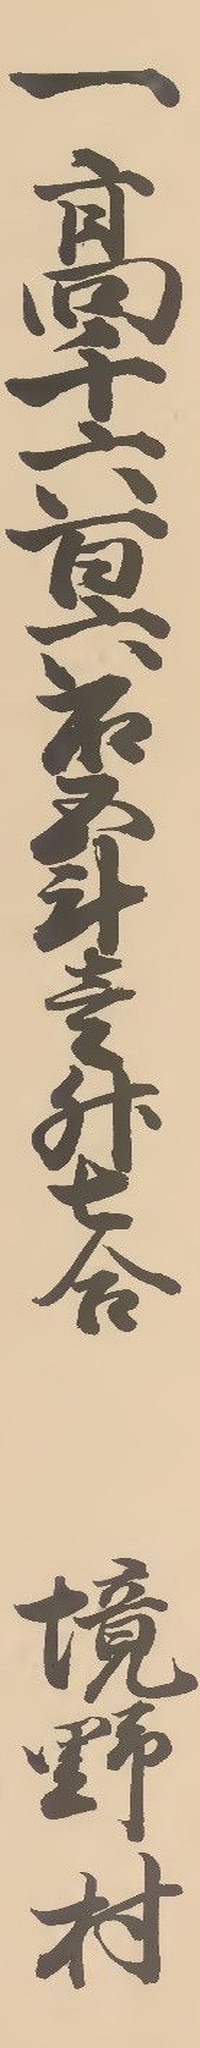一高千六百六石五斗壱升七合境野村
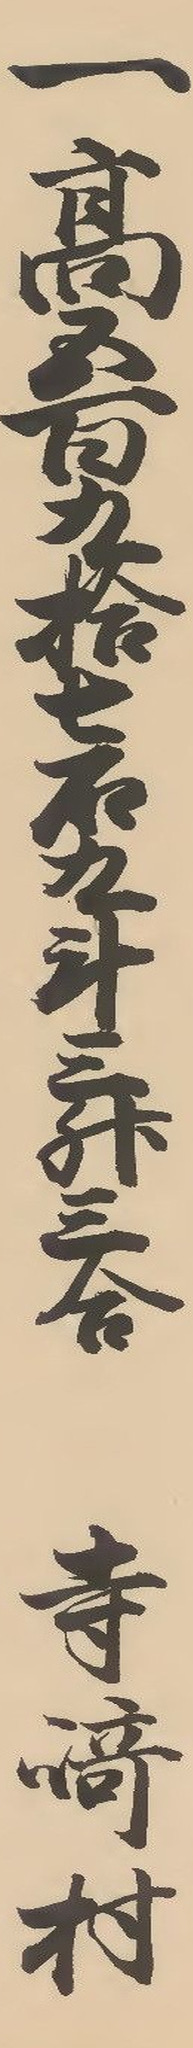一高五百九拾七石九斗三升三合寺崎村
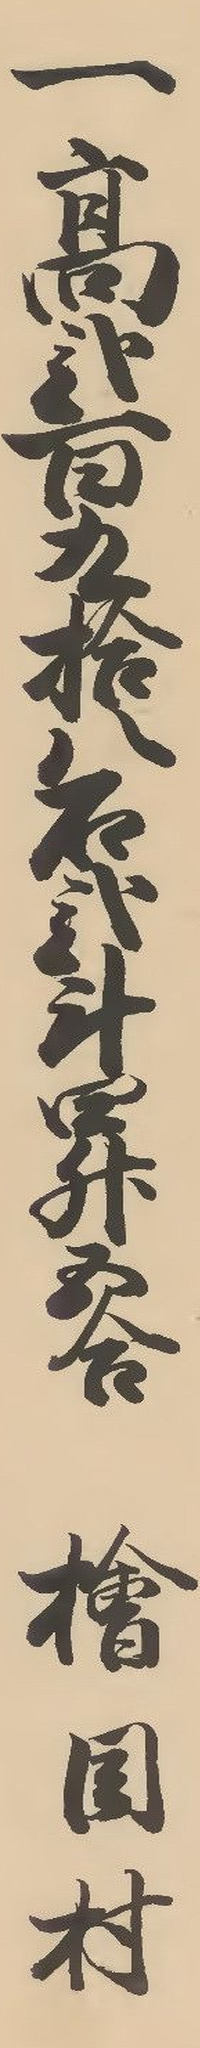一高弐百九拾八石弐斗四升五合桧目村

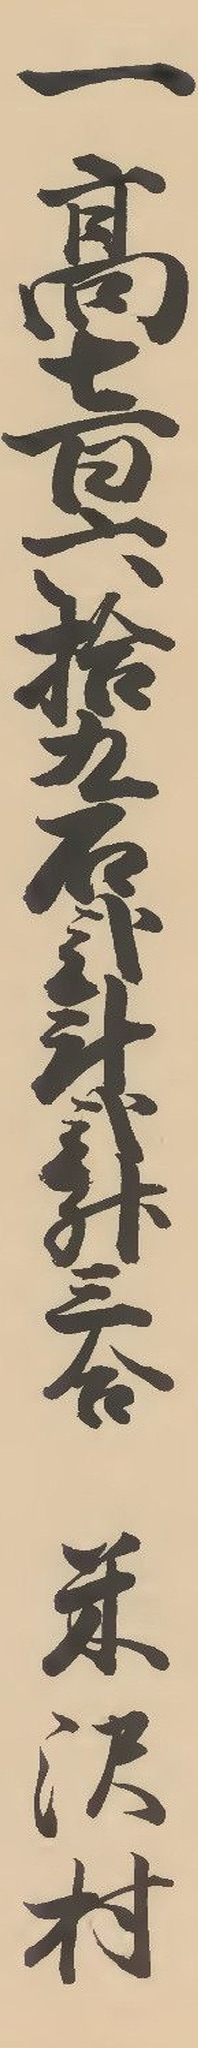一高七百六拾九石弐斗弐升三合米沢村
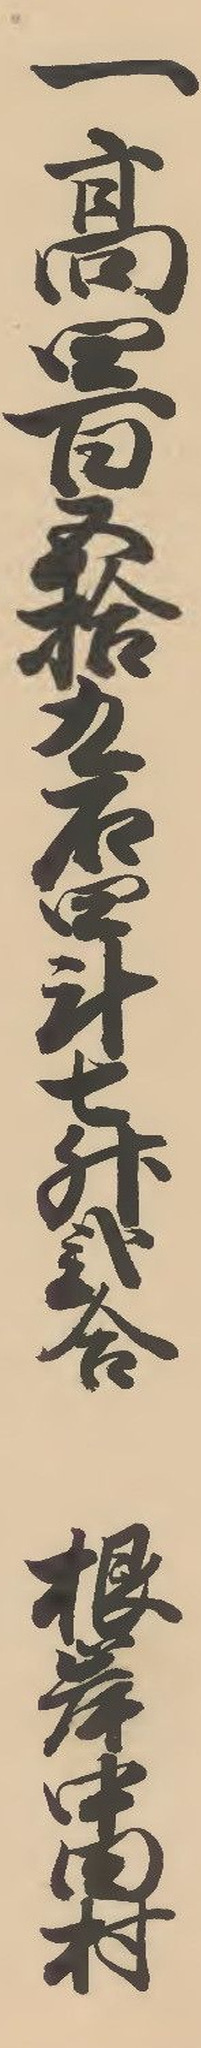一高四百五拾九石四斗七升弐合根岸中田村
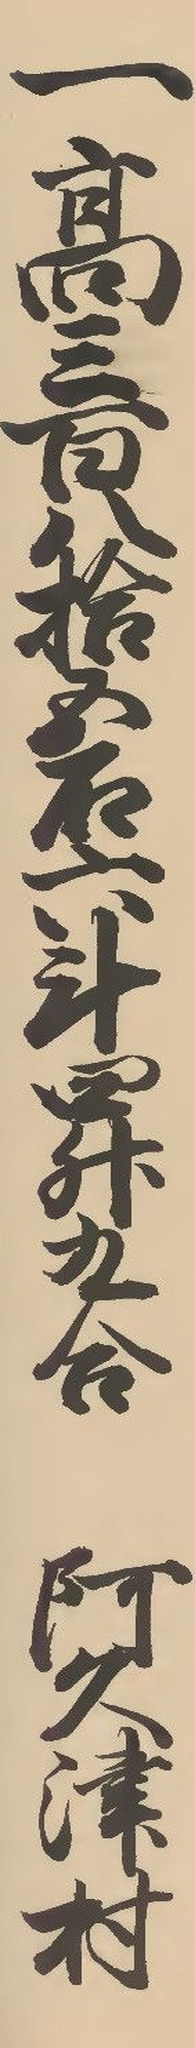一高三百八拾五石六斗四升九合阿久津村
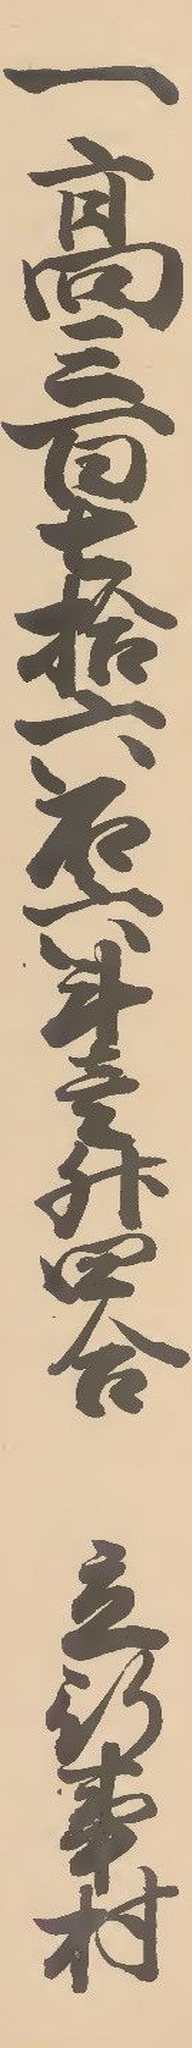一高三百七拾六石六斗壱升四合立行事村
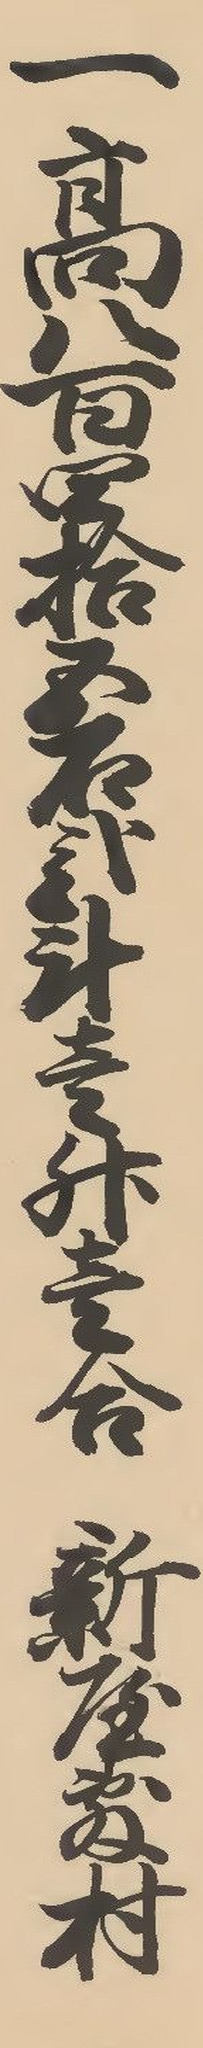一高八百四拾五石弐斗壱升壱合新屋敷村
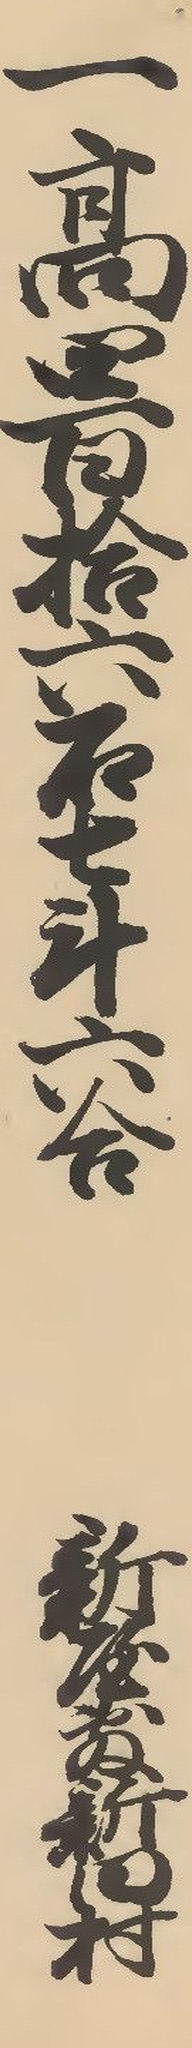一高四百拾六石七斗六合新屋敷新田村
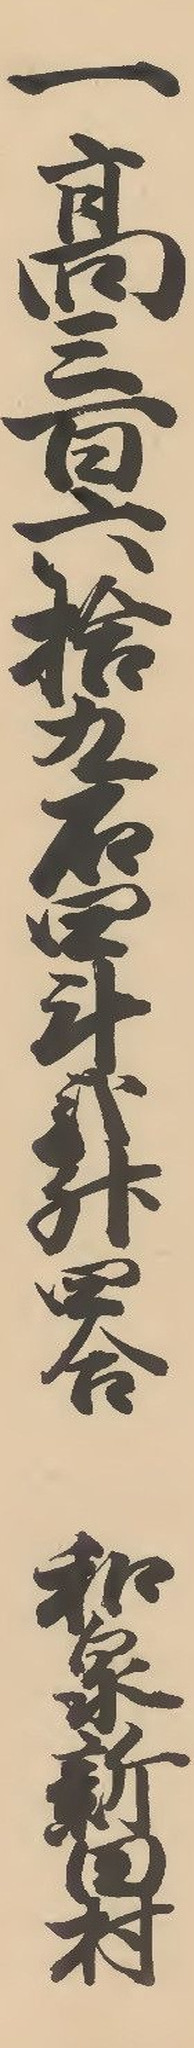一高三百六拾九石四斗弐升四合和泉新田村

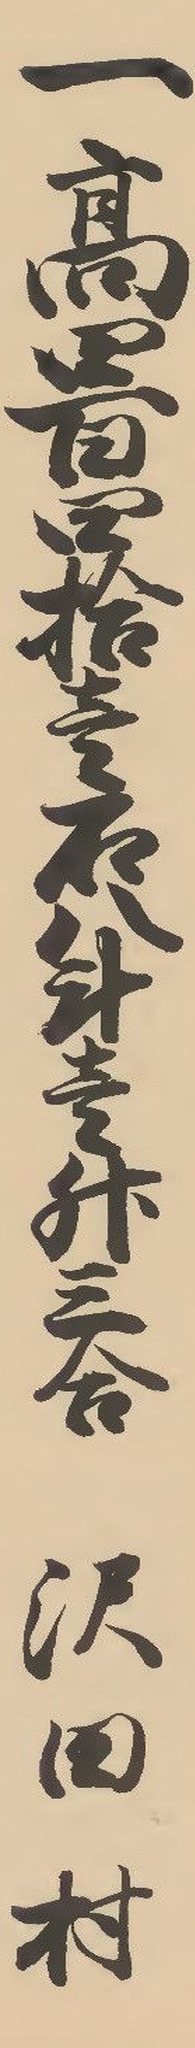一高四百四拾壱石八斗壱升三合沢田村
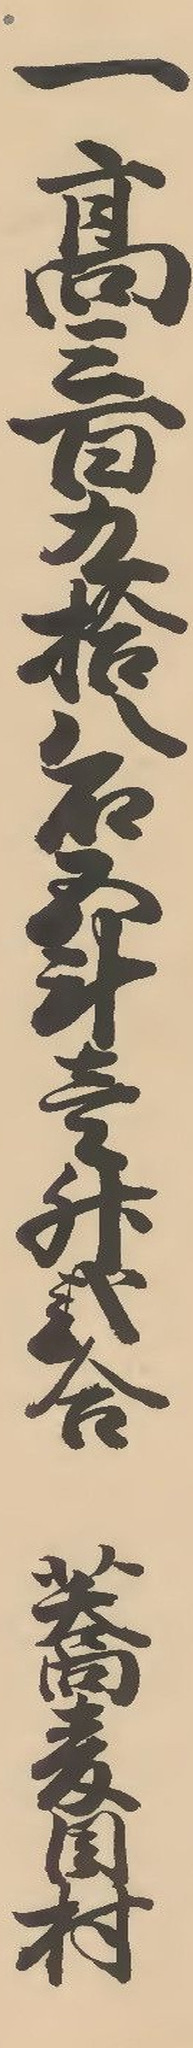一高三百九拾八石五斗壱升弐合蕎麦目村
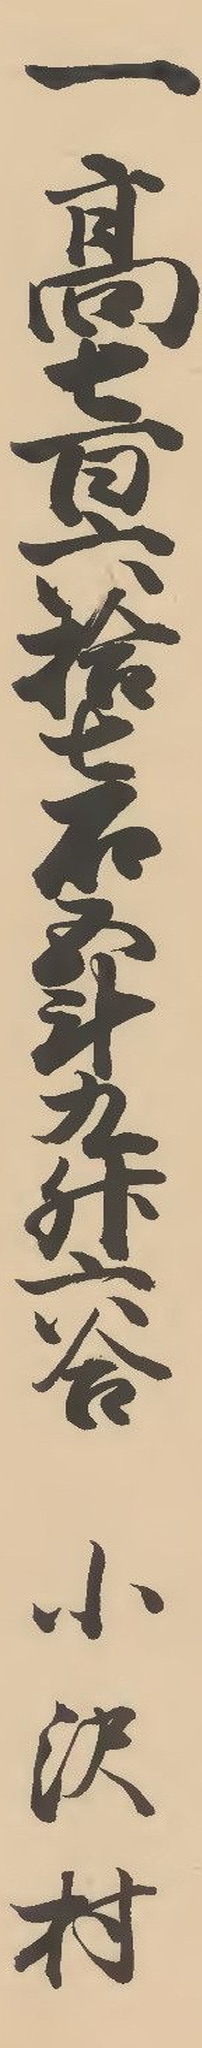一高七百六拾七石五斗九升六合小沢村
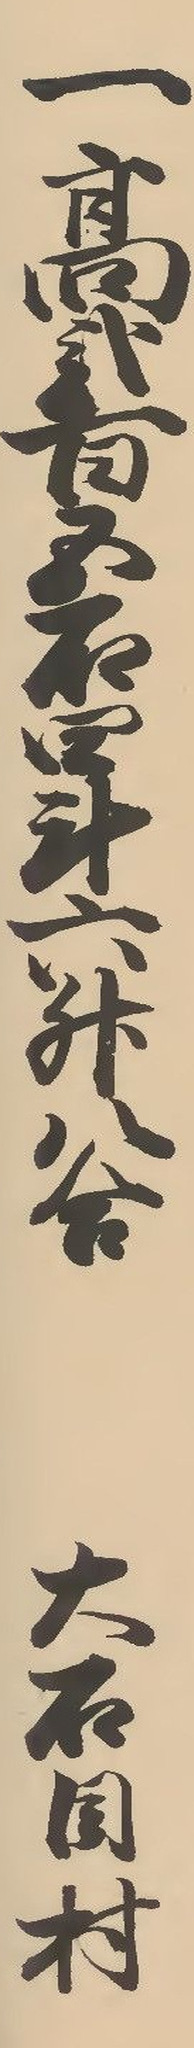一高弐百五石四斗六升八合大石目村
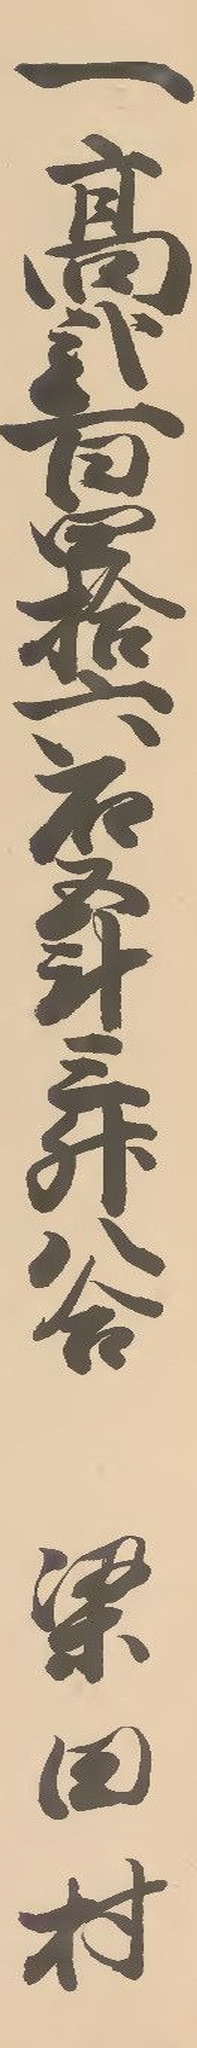一高弐百四拾六石五斗三升八合梁田村
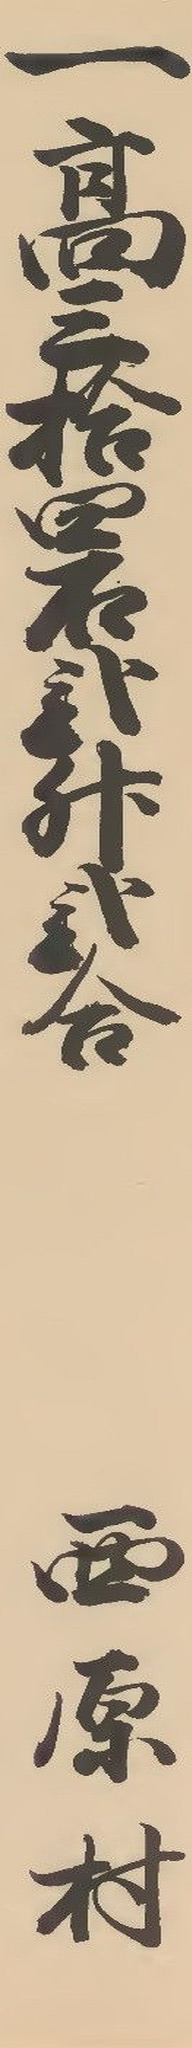一高三拾四石弐升弐合西原村
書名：陸奥国郷帳　１
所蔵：国立公文書館 National Archives of Japan
